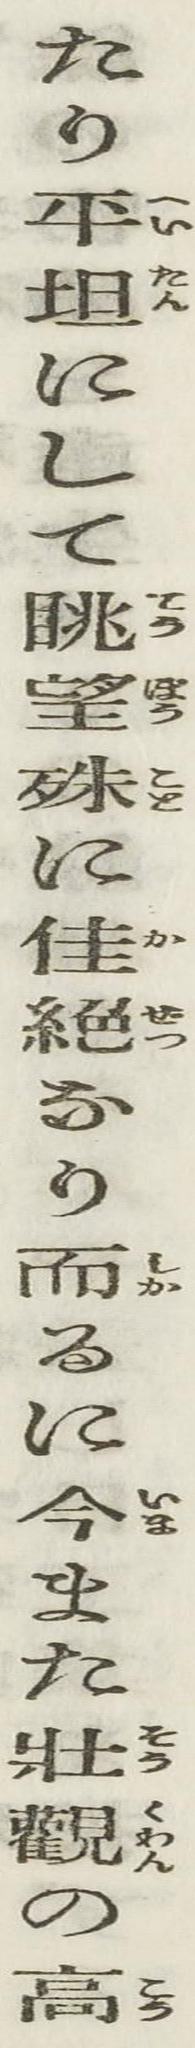たり平坦にして眺望殊に佳絶なり而るに今また壮観の高
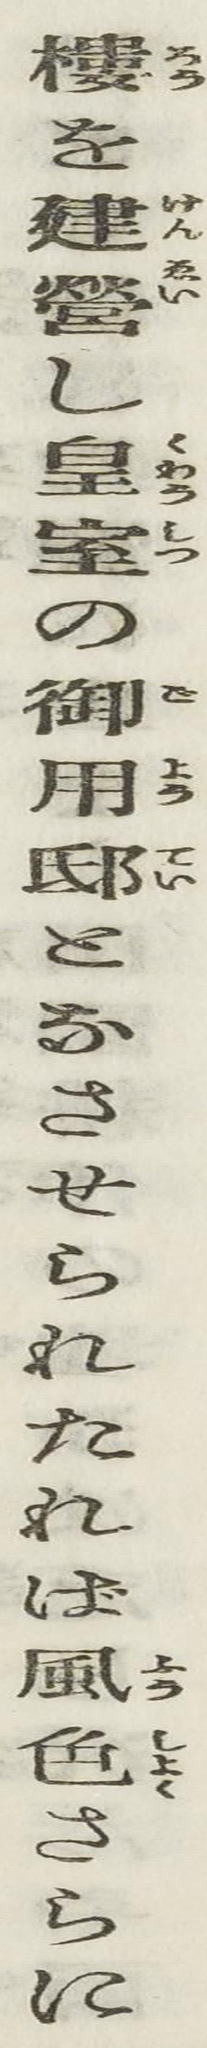樓を建営し皇室の御用邸となさせられたれば風色さらに
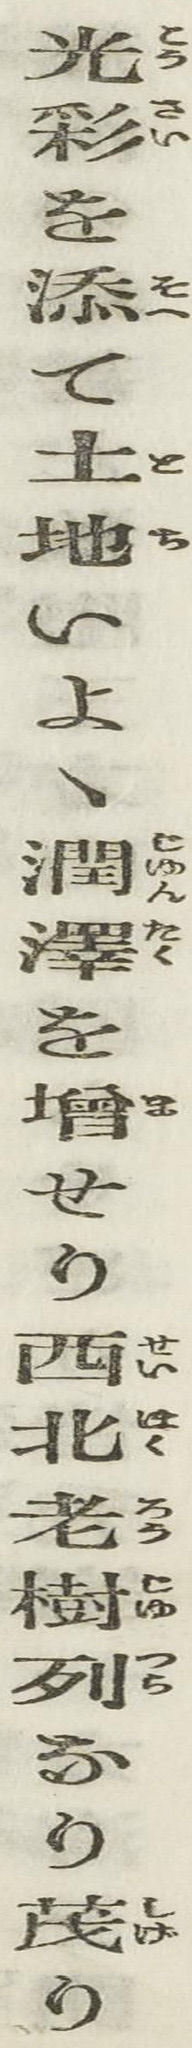光彩を添て土地いよゝ潤沢を増せり西北老樹列なり茂り

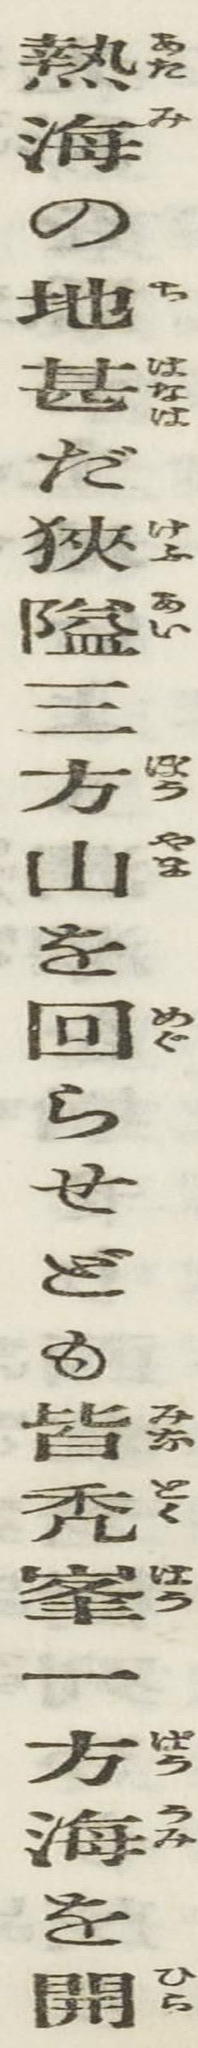熱海の地甚だ狭隘三方山を回らせども皆禿峯一方海を開
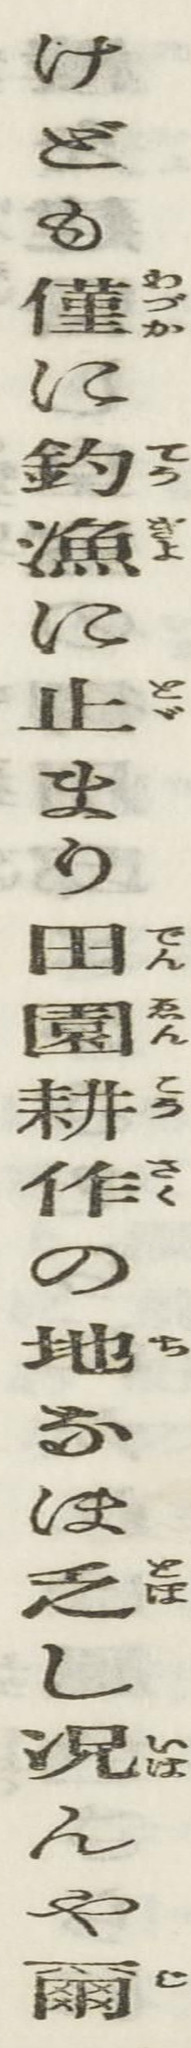けども僅に釣漁に止まり田園耕作の地なほ乏し況んや爾
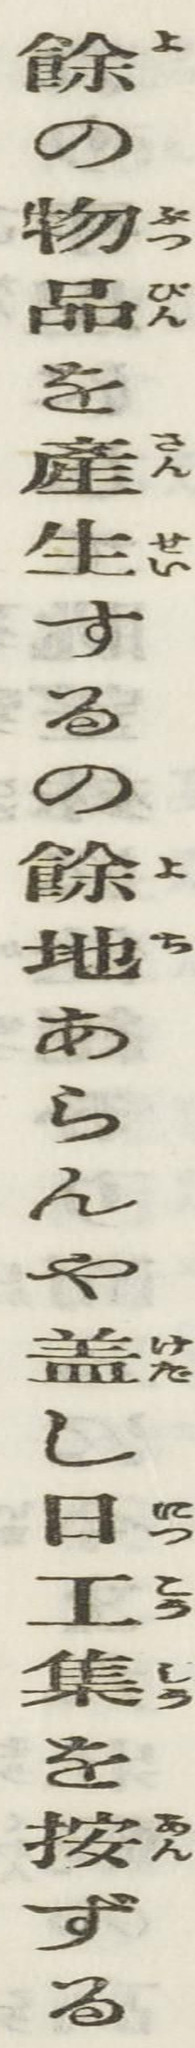余の物品を産生するの余地あらんや蓋し日工集を按ずる
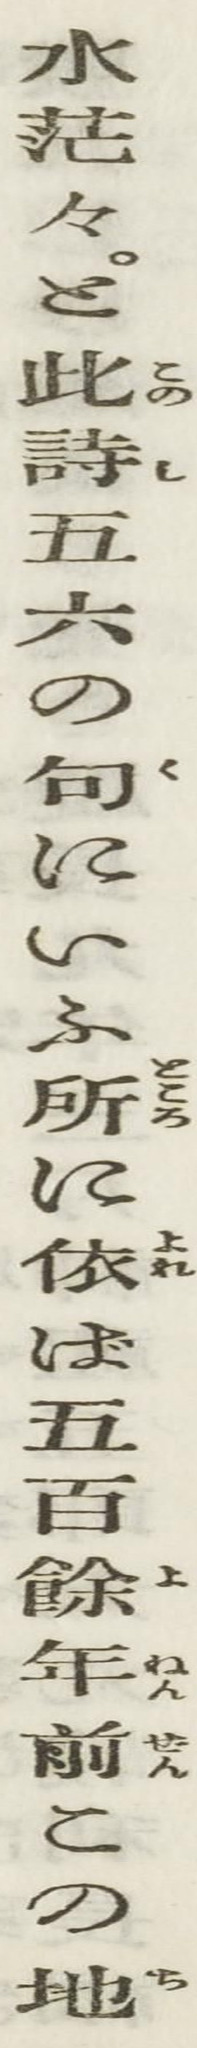水茫々。と此詩五六の句にいふ所に依ば五百余年前この地
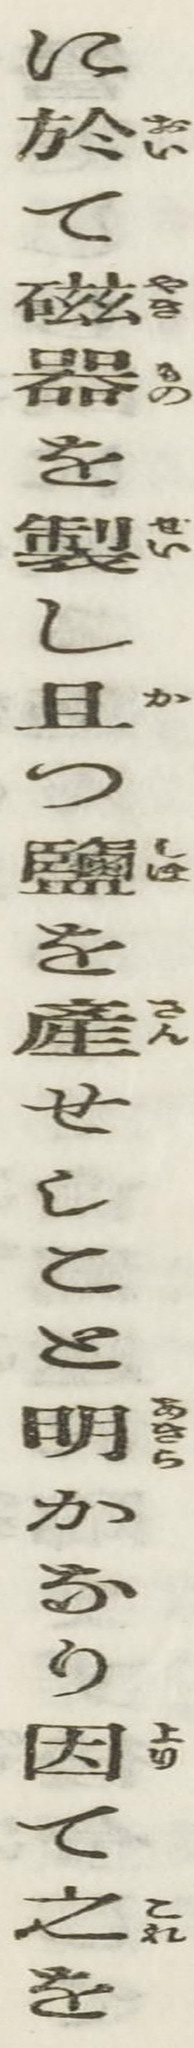に於て磁器を製し且つ塩を産せしこと明かなり因て之を
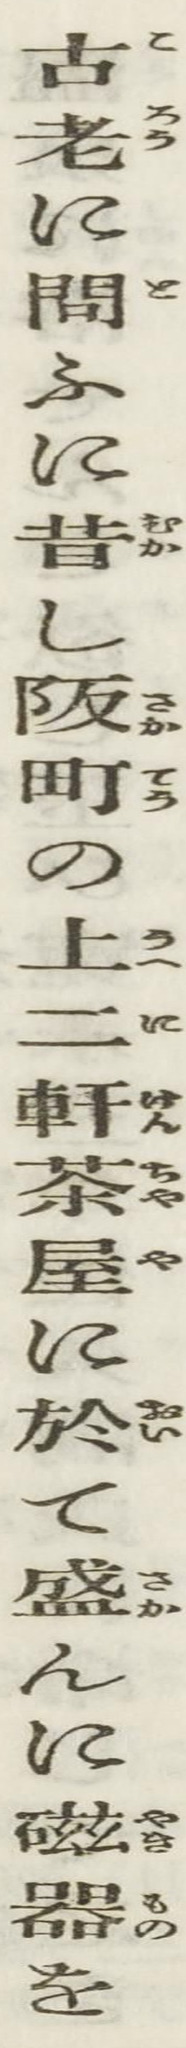古老に問ふに昔し阪町の上二軒茶屋に於て盛んに磁器を
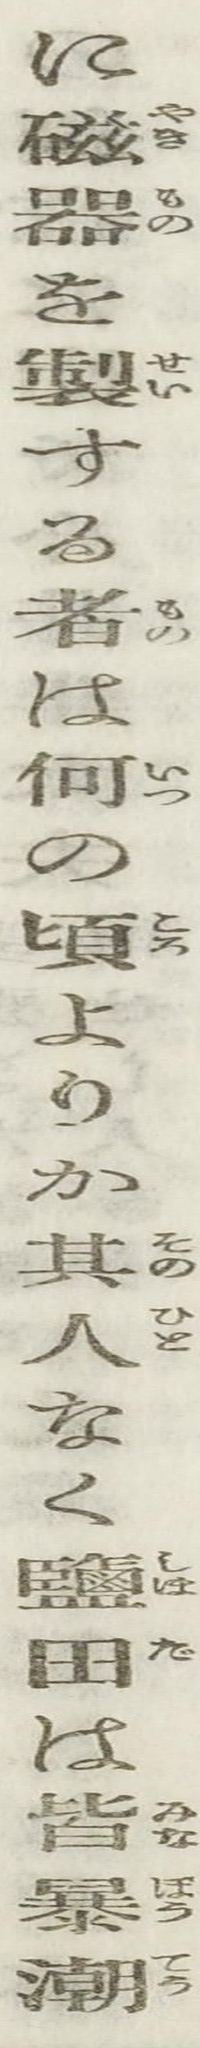に磁器を製する者は何の頃よりか其人なく塩田は皆暴潮
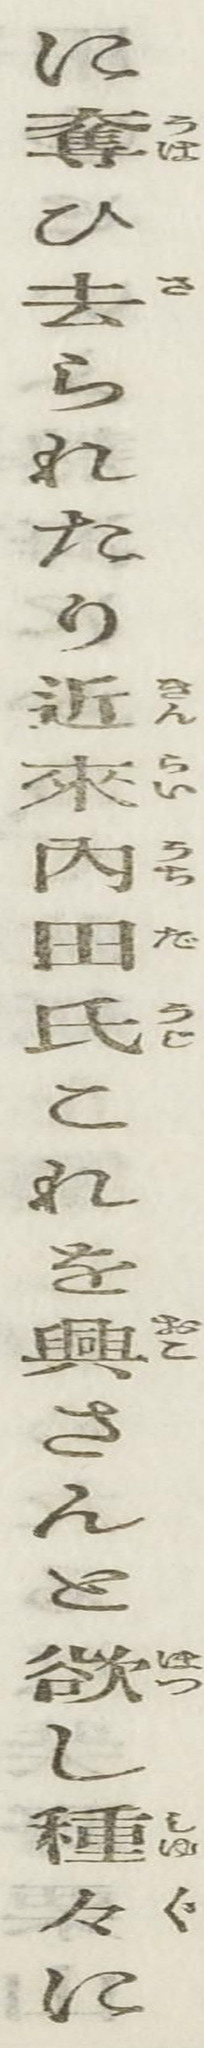に奪ひ去られたり近来内田氏これを興さんと欲し種々に
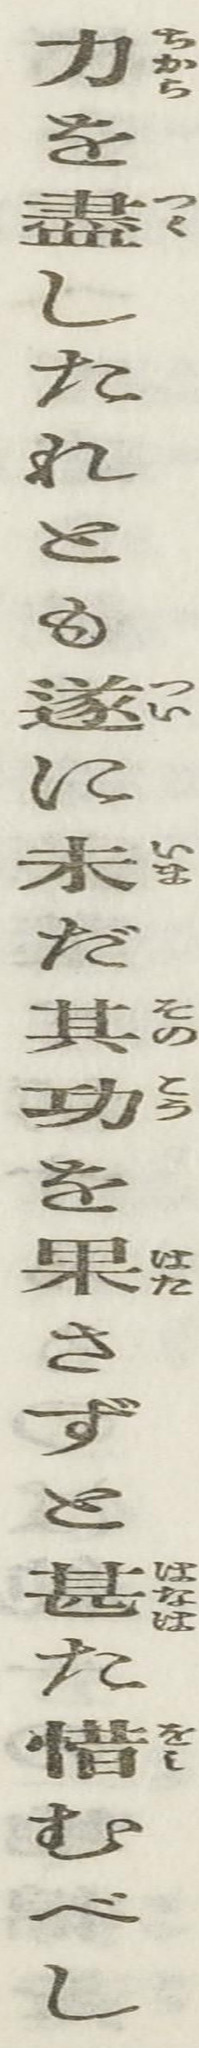力を尽したれとも遂に未だ其功を果さずと甚だ惜むべし
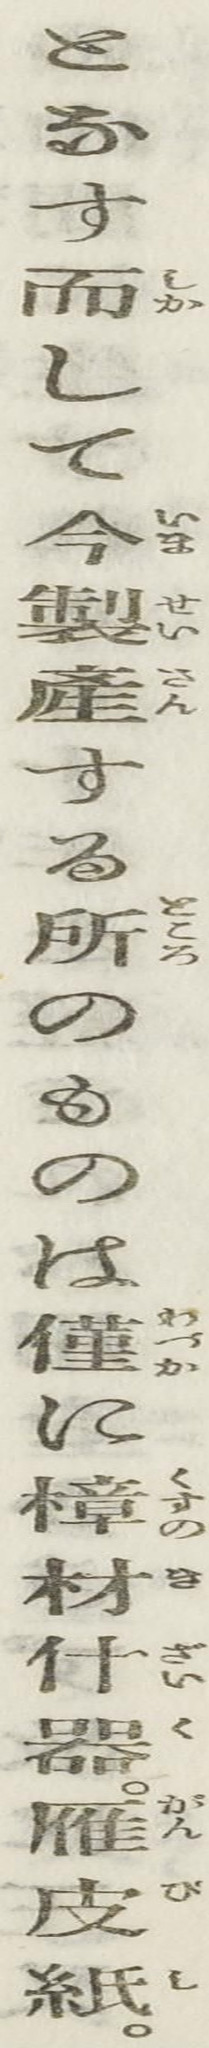となす而して今製産する所のものは僅に樟材什器。雁皮紙。
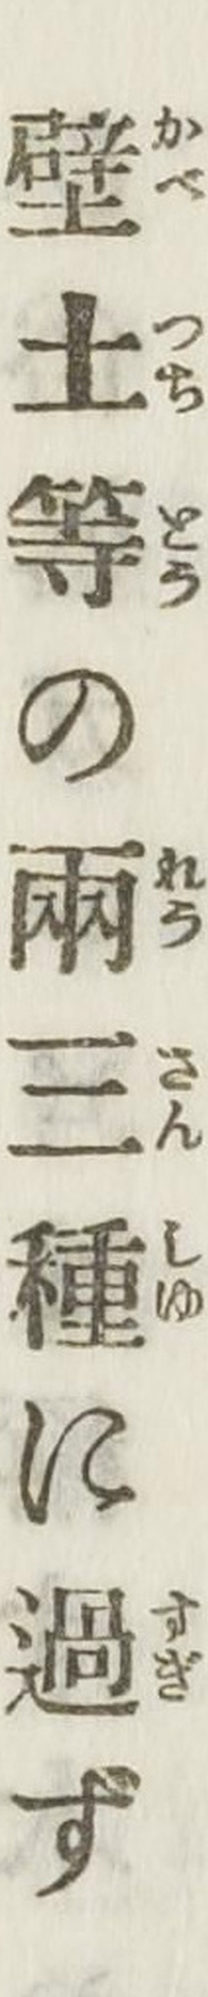壁土等の両三種に過ず
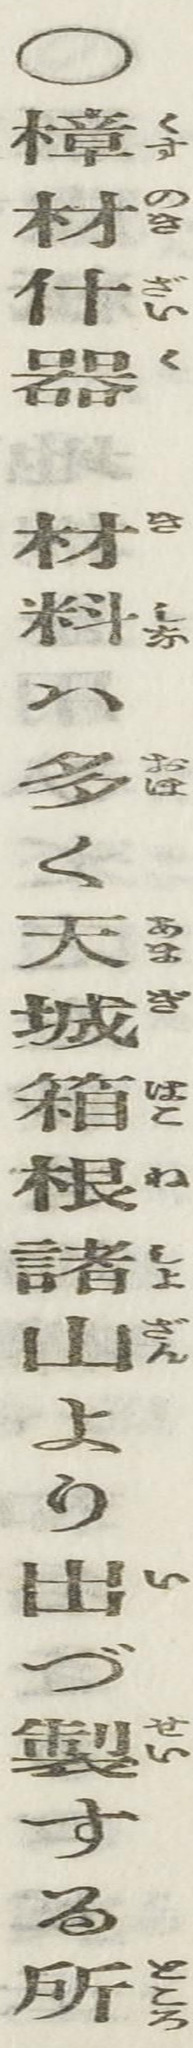○樟材什器材料は多く天城箱根諸山より出づ製する所
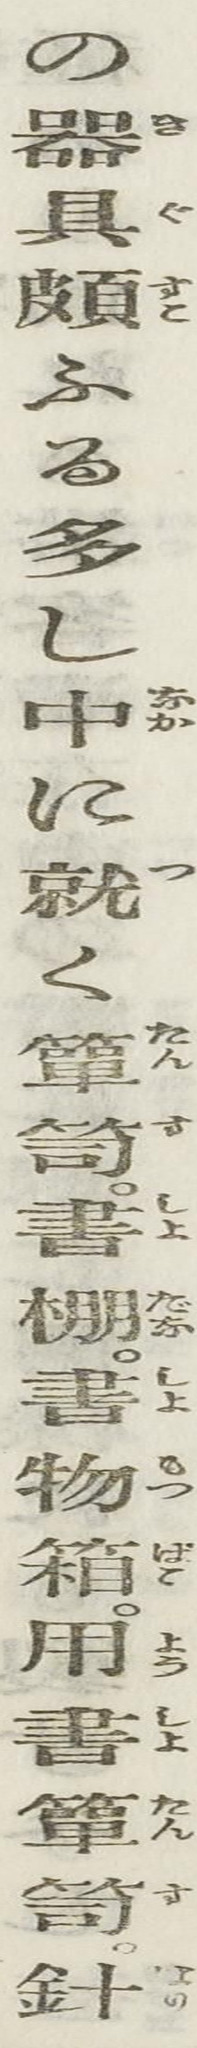の器具頗ふる多し中に就く箪笥。書棚。書物箱。用書。箪笥針
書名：熱海獨案内　全
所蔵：東京大学地震研究所図書室 Earthquake Research Institute Library, The University of Tokyo, JAPAN
